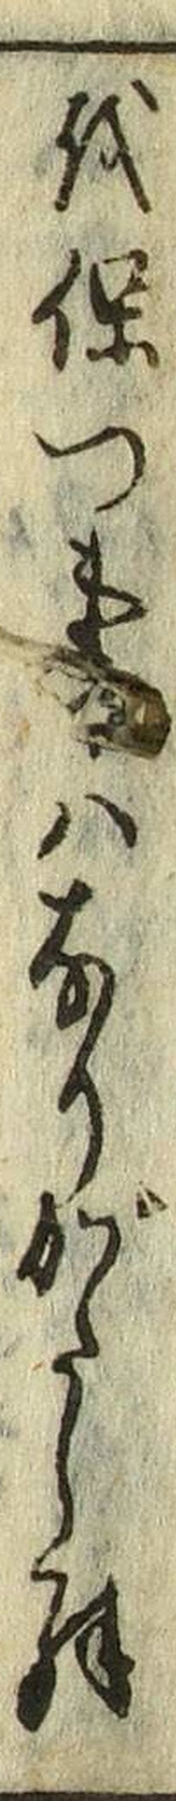を保つ事はなりがたし誠
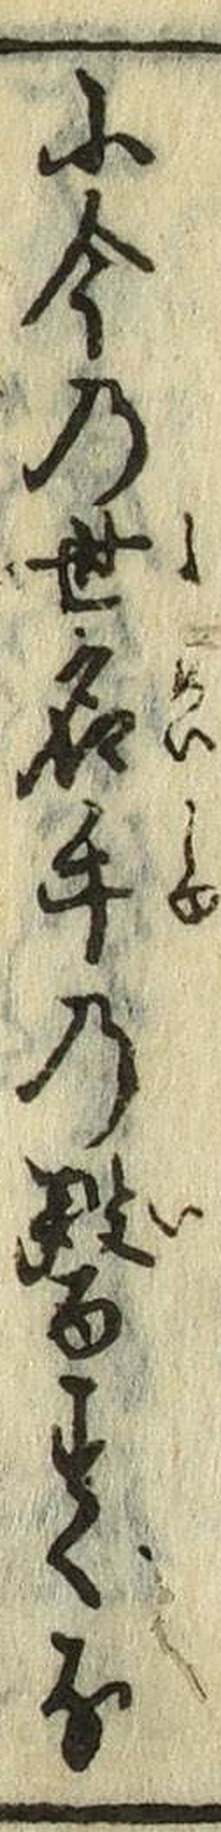に今の世名手の医すくな
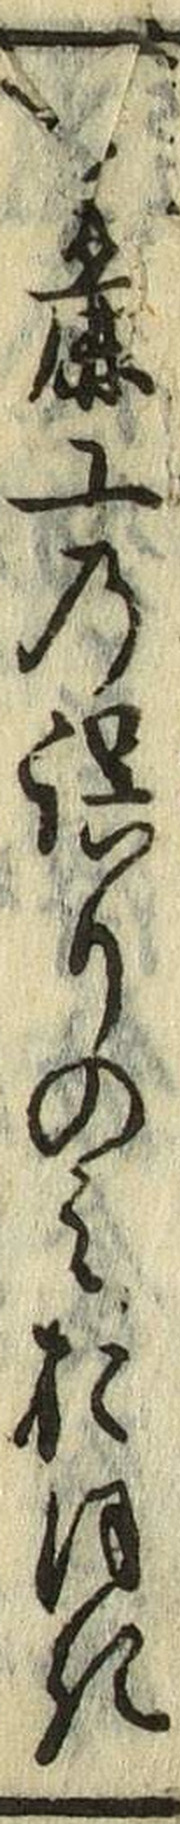麤工の誤りのみおほき
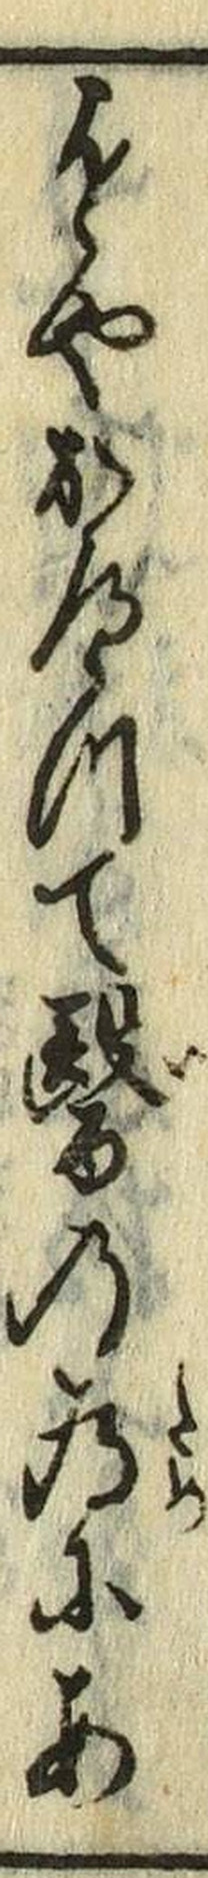をやかへつて医の為にあ
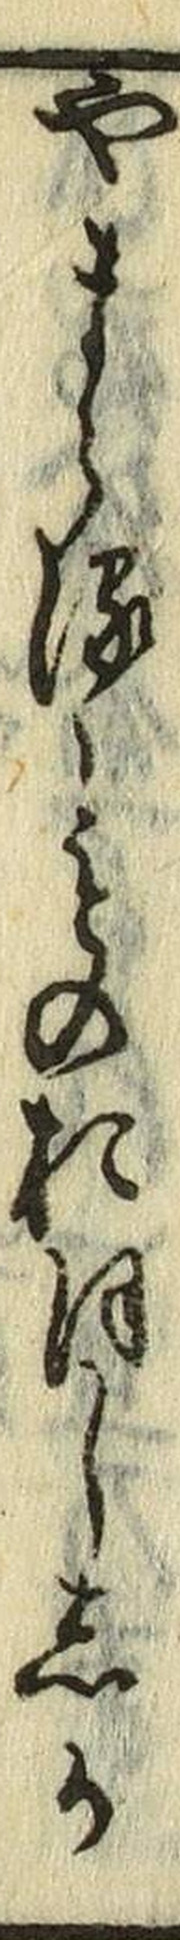やまらるゝものおほししか
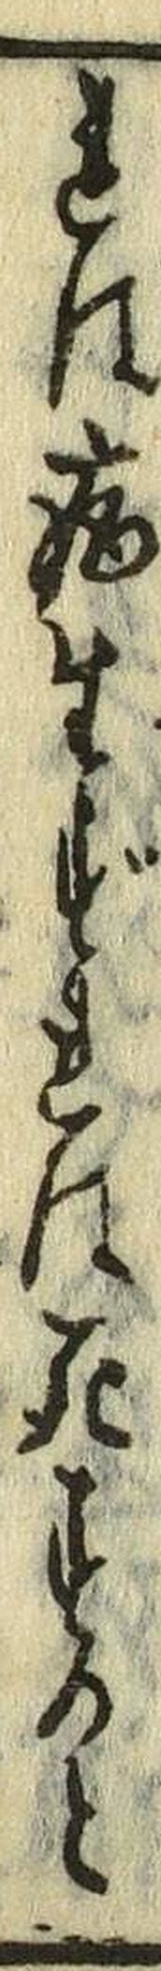れば病生ずれは死すると
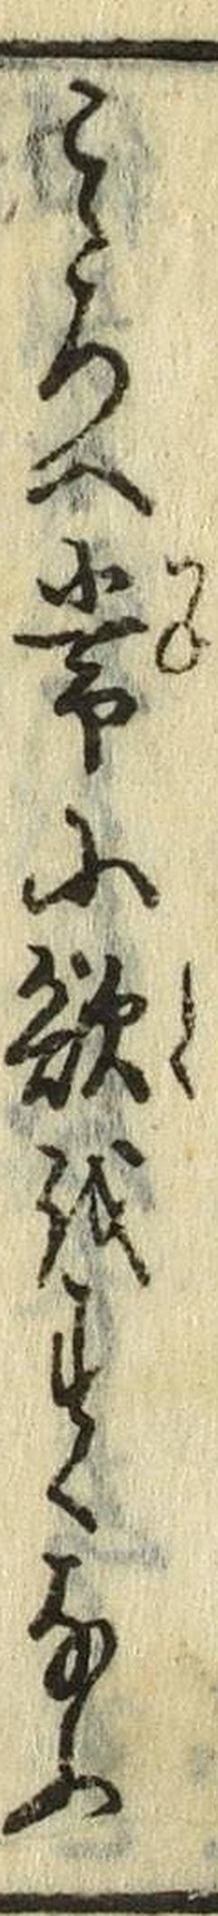こゝろへ常に欲をすくなふ
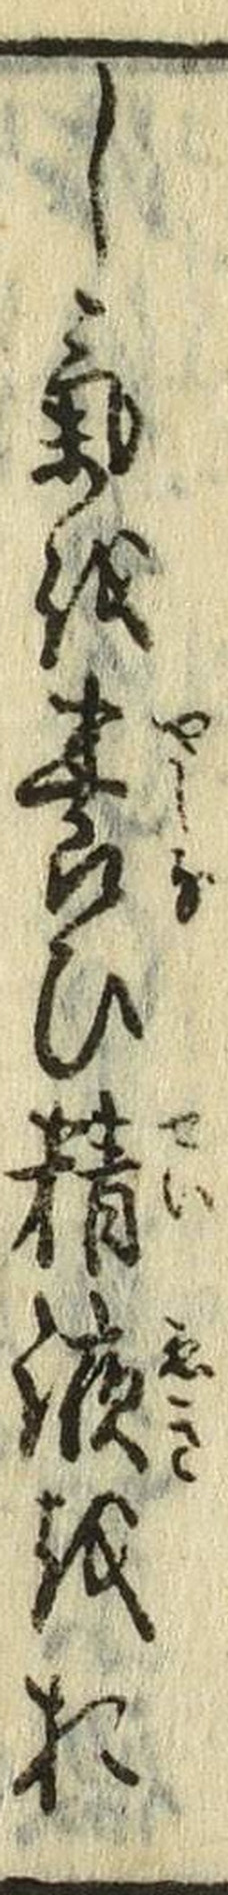し気を養ひ精液をお
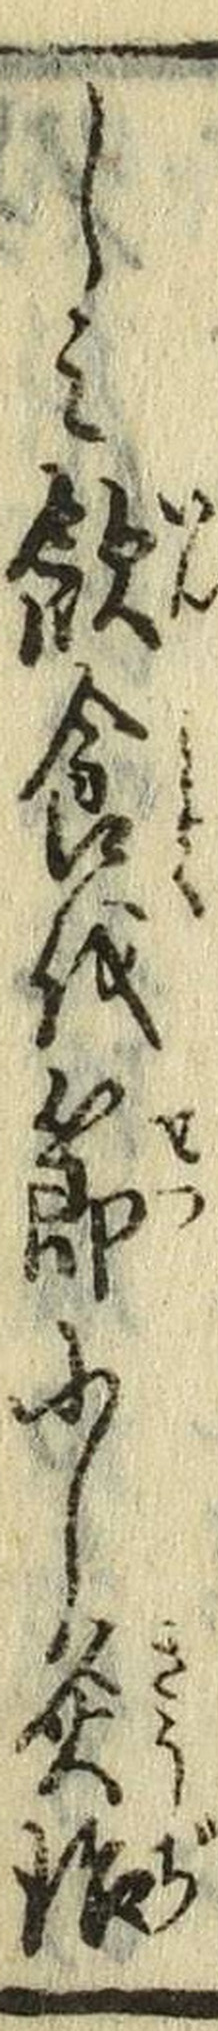しみ飲食を節にし灸治
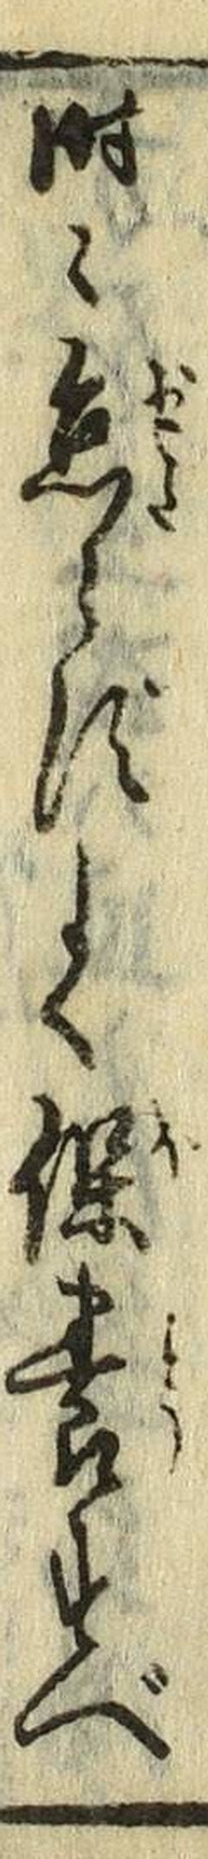時々怠らずよく保養すべ
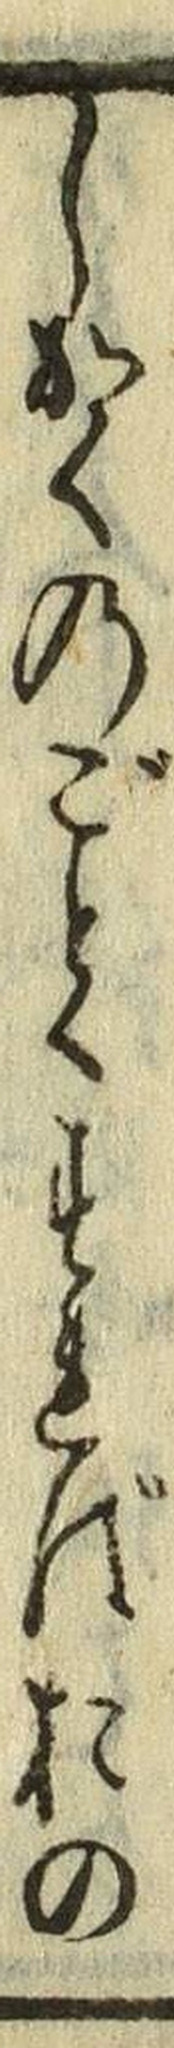しかくのごとくすればおの
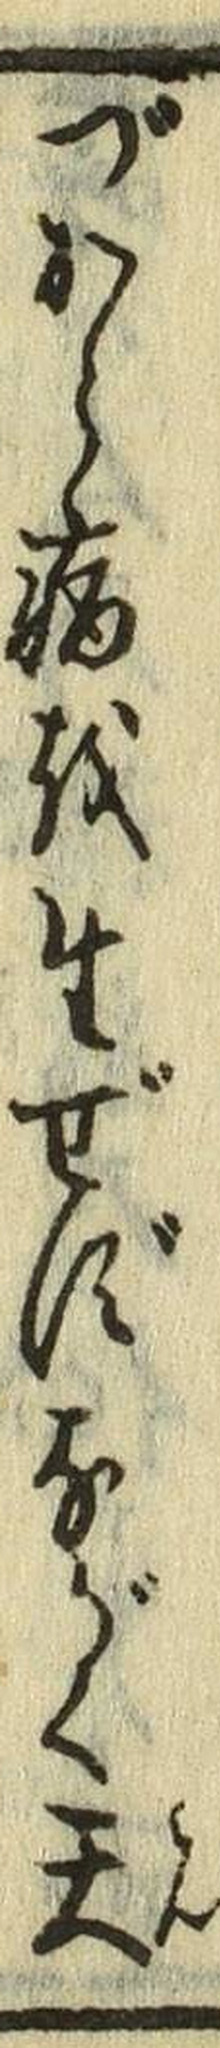づから病を生ぜずながく天
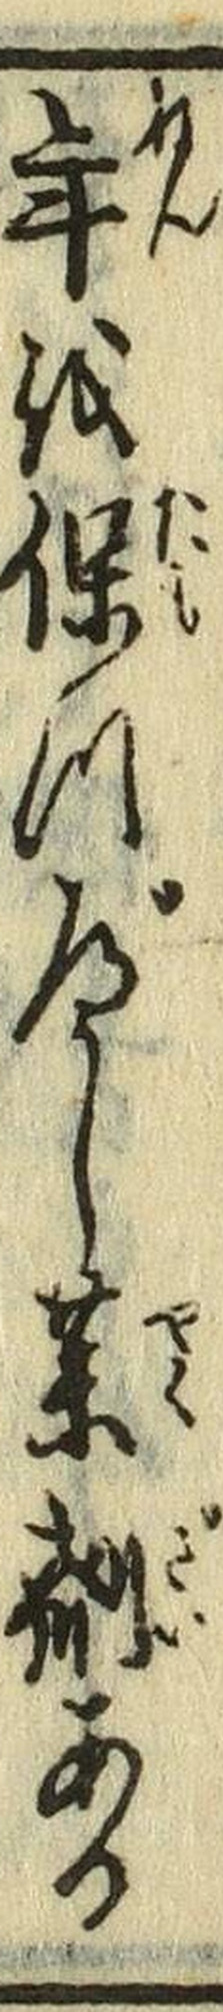年を保つべし薬剤ある
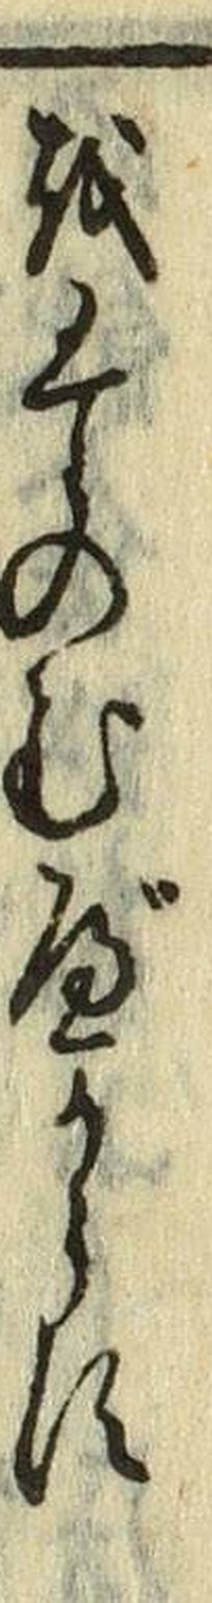をたのむべからす
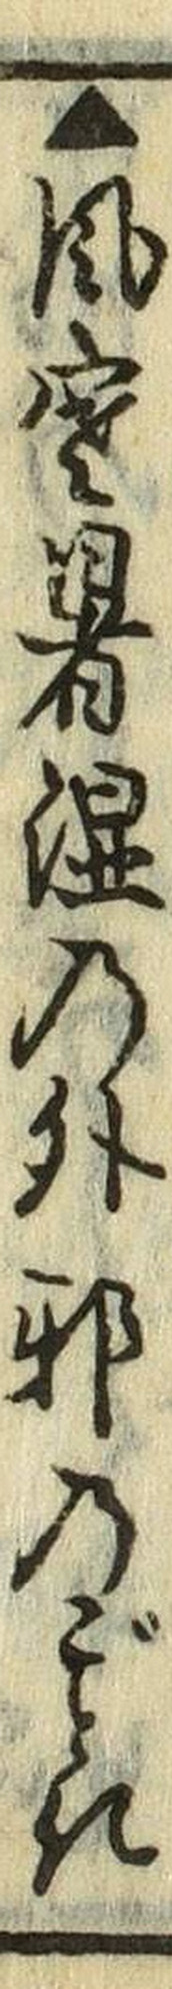▲風寒暑湿の外邪のごとき
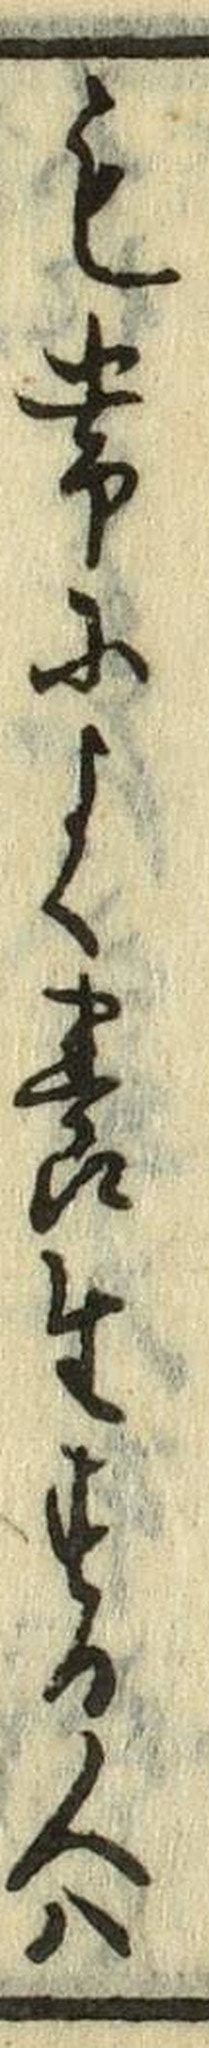も常によく養生する人は
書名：居家養生記
